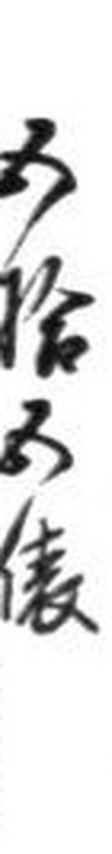五拾五俵
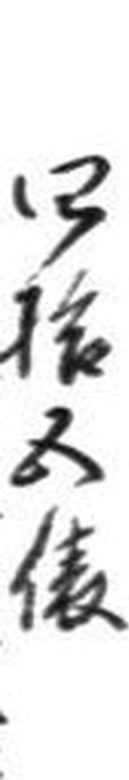四拾五俵
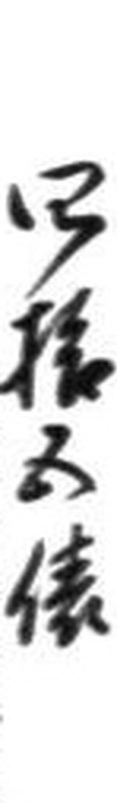四拾五俵
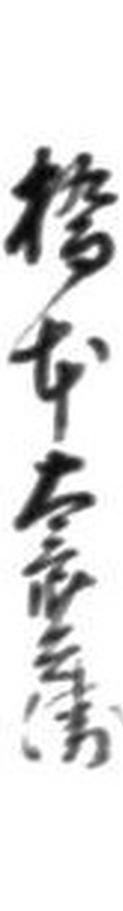橋本治兵衛

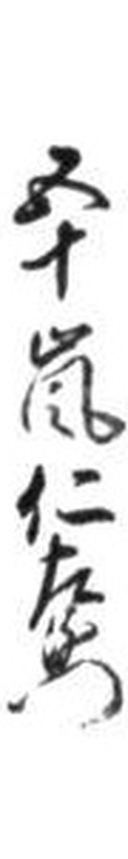五十嵐仁左衛門
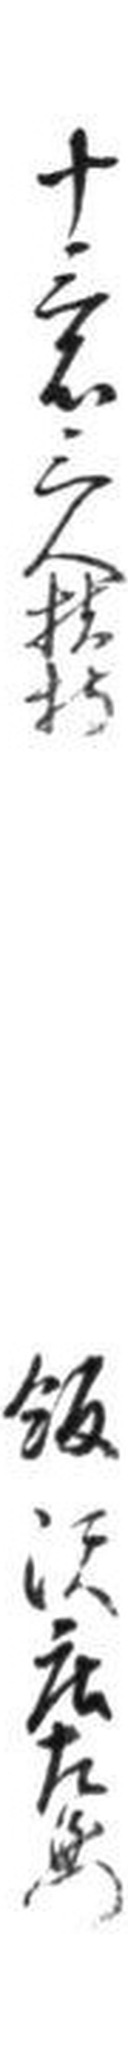十三石三人扶持飯沢庄左衛門
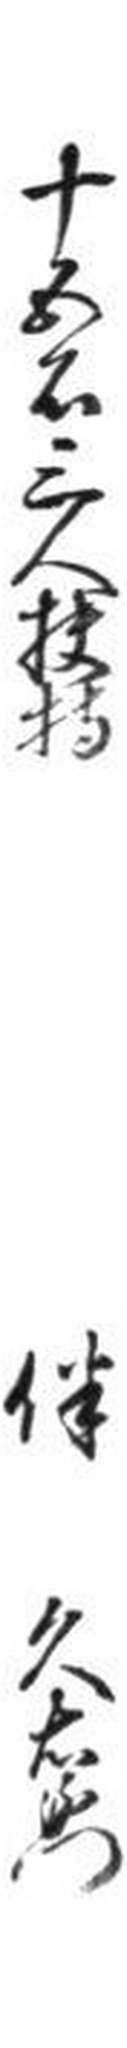十五石三人扶持伴久右衛門
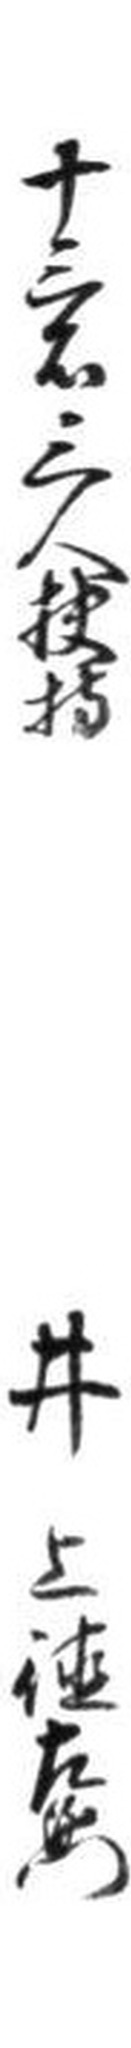十三石三人扶持井上徳左衛門
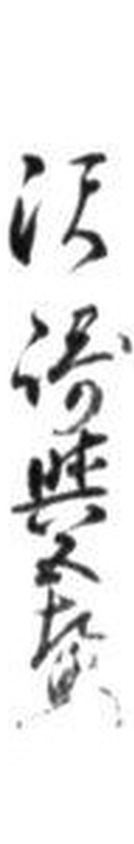沢崎与五左衛門
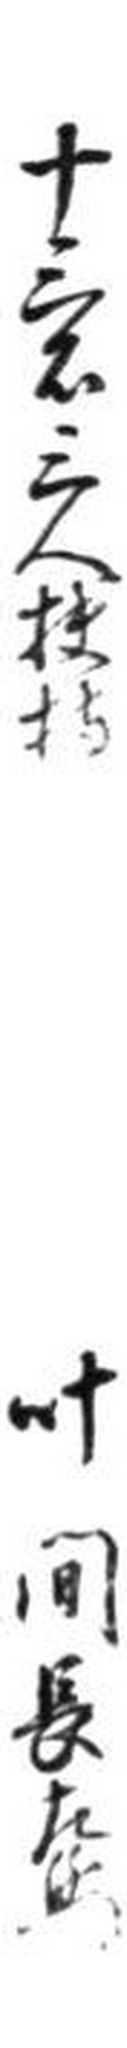十三石三人扶持叶間長左衛門
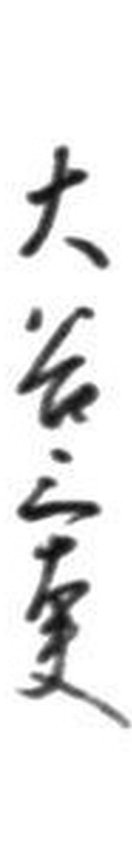大谷三大夫
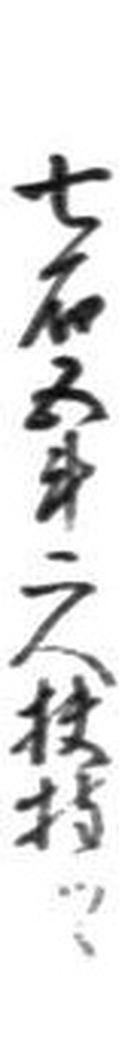七石五斗二人扶持ツヽ宗知

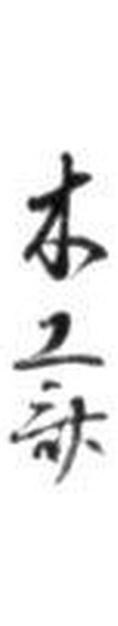木工斎
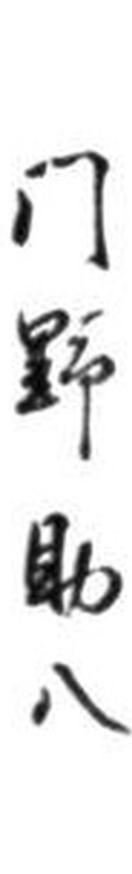門野助八
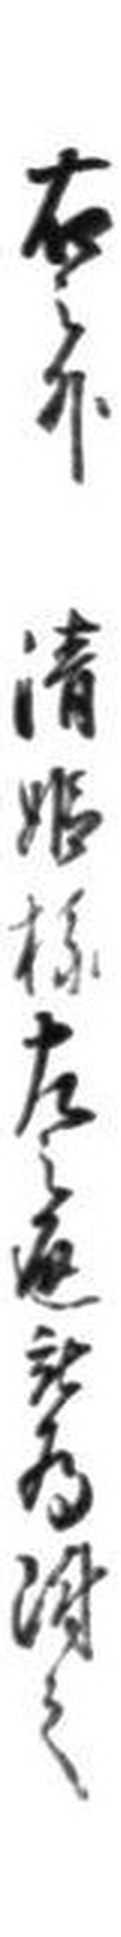右之外清姫様左之通被為附之
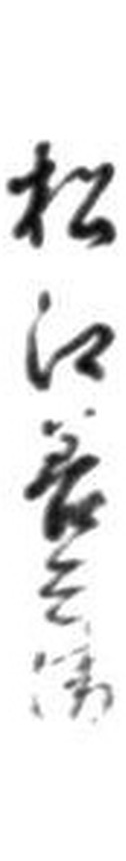松江善兵衛
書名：家譜 十五 綱昌公 従天和元年到元禄十二年
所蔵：福井県文書館 Fukui Prefectural Archives
